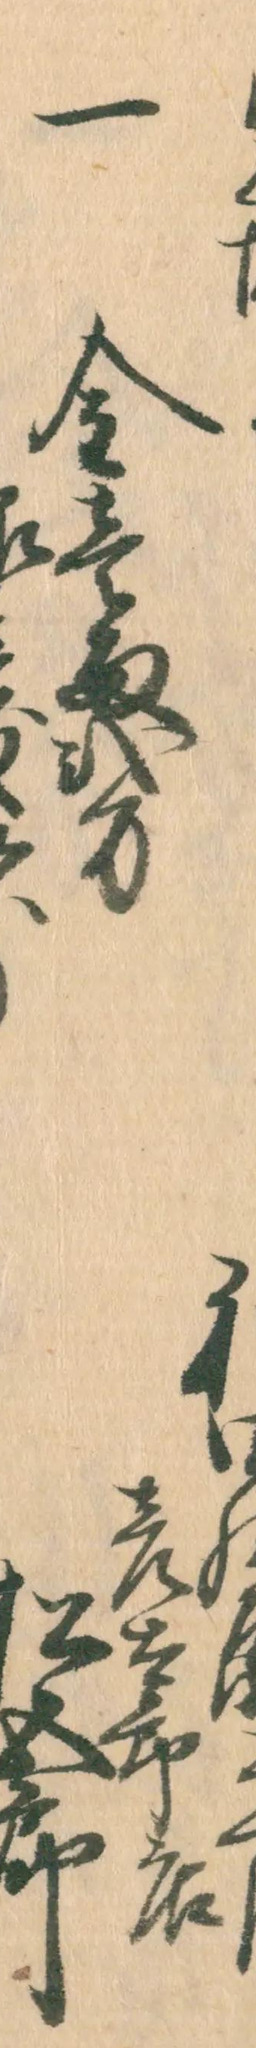一金壱両弐分彦太郎店
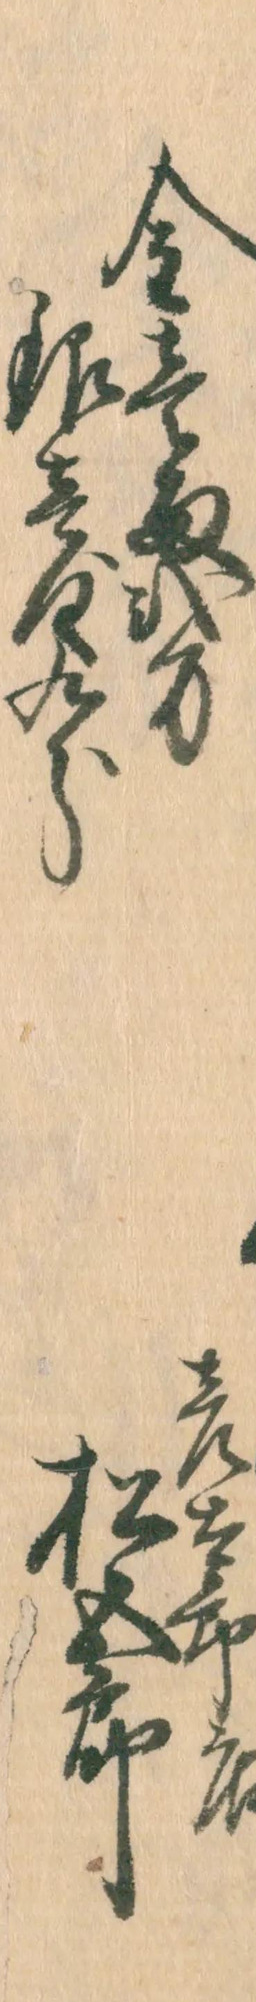銀壱匁九分松五郎
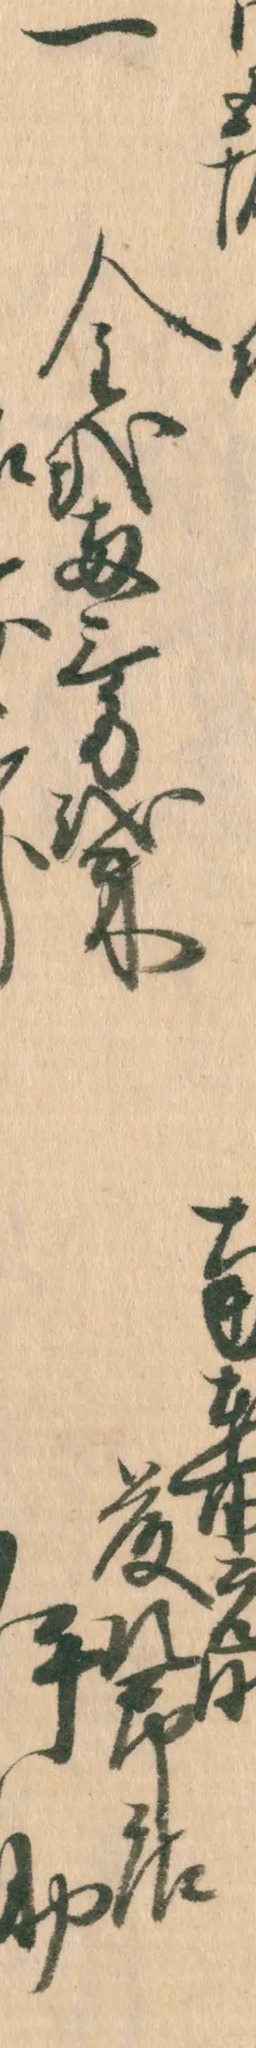一金弐両三分弐朱藤次郎店
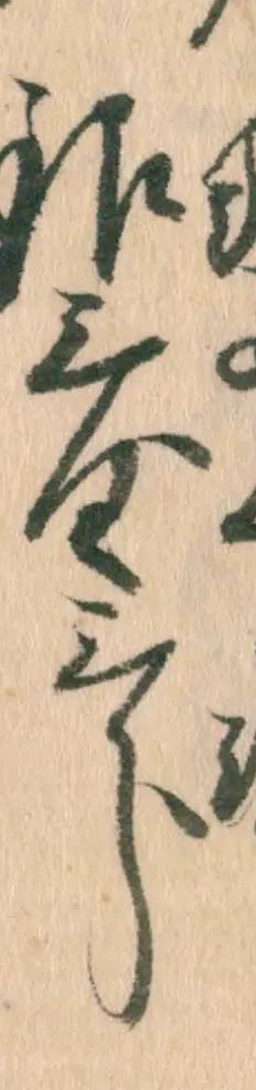銀三匁四分
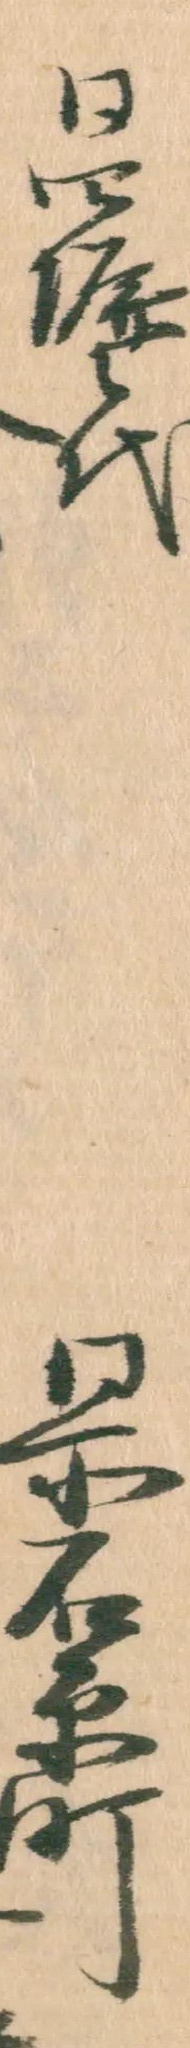同四塀之代同所石原町
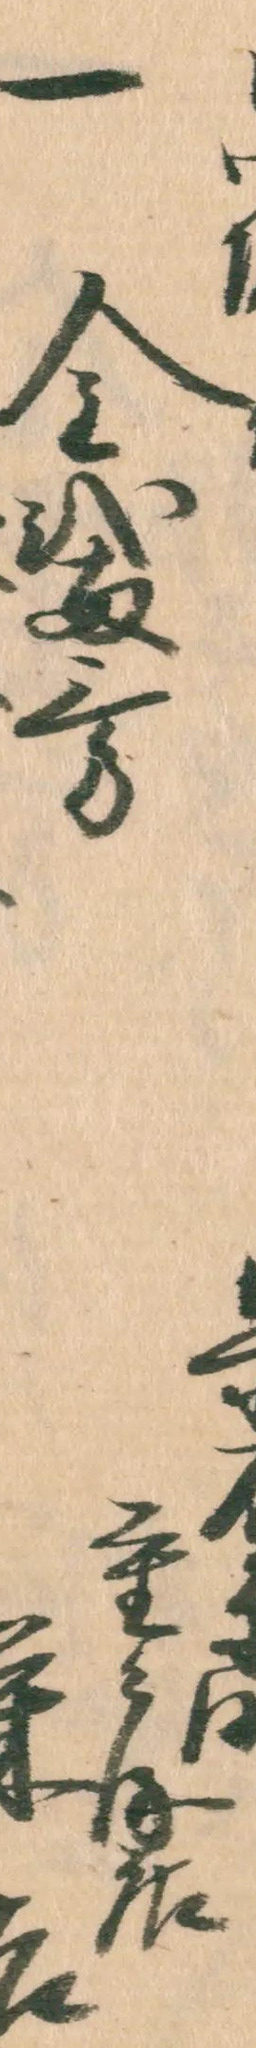一金弐両三分金兵衛店
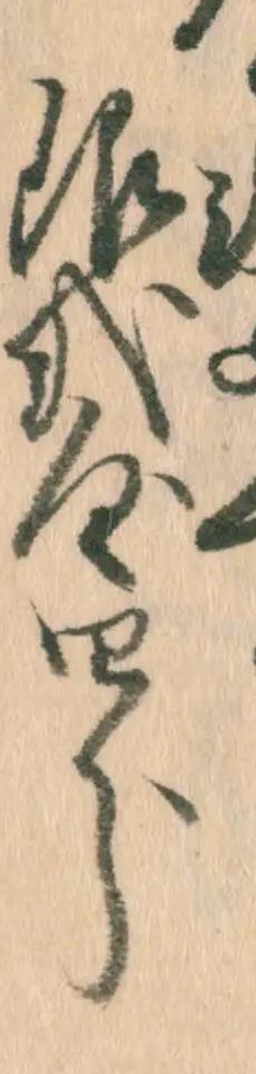銀三匁四分
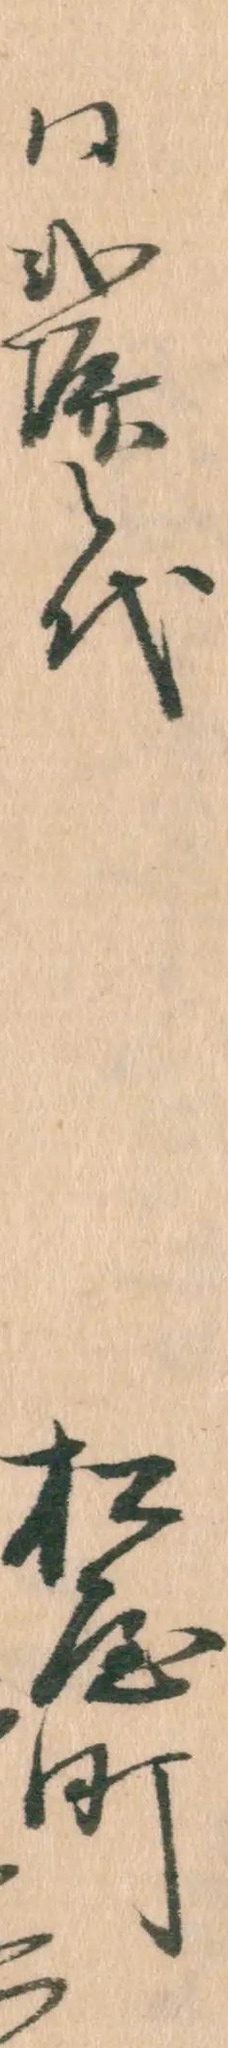同弐塀之代松屋町
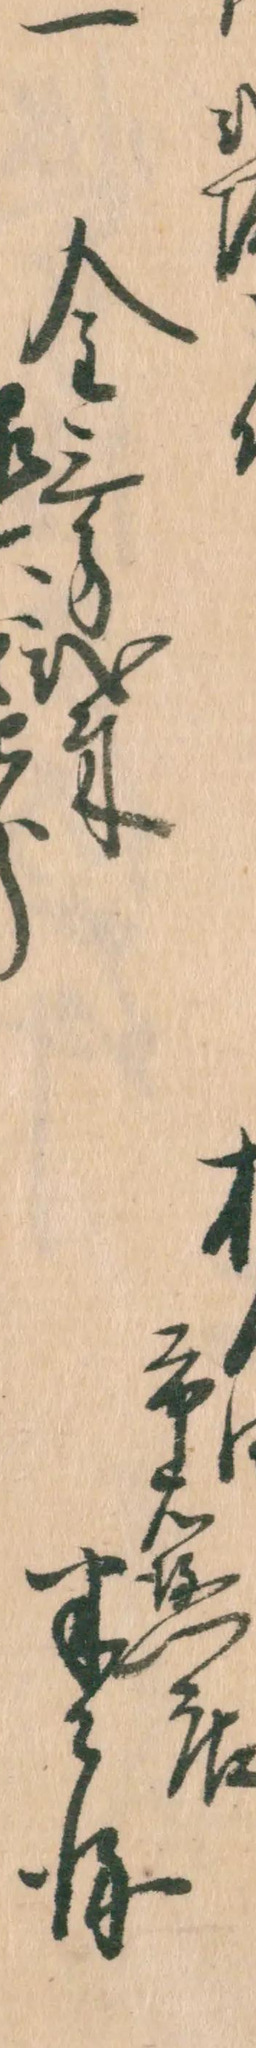一金三分弐朱市右衛門店
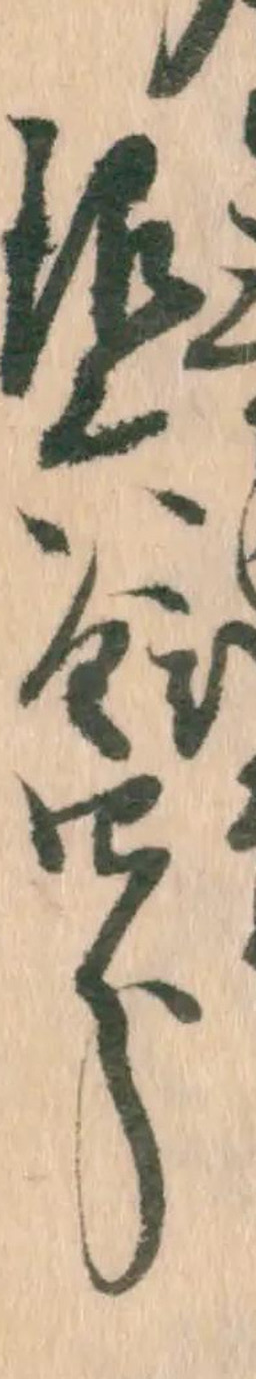銀三匁四分
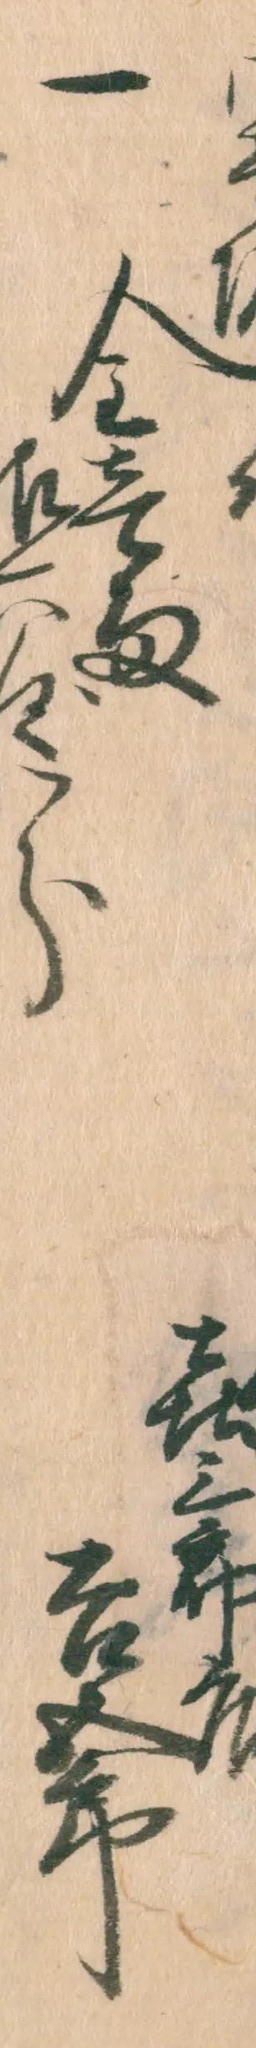一金壱両喜三郎店
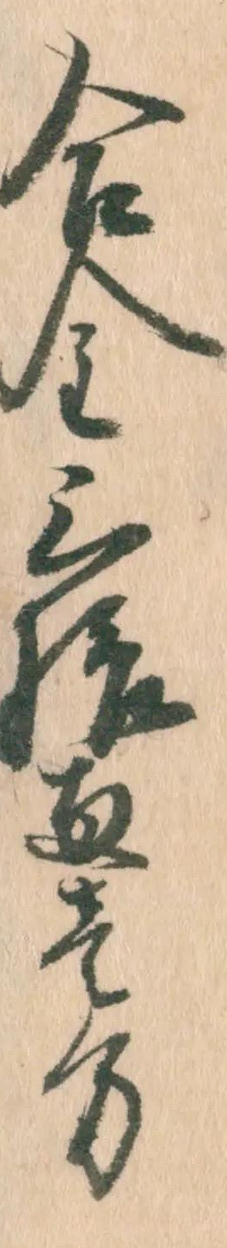合金三拾両壱分
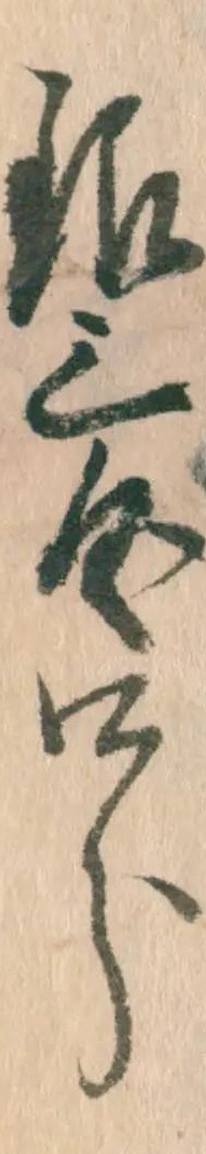銀三匁四分

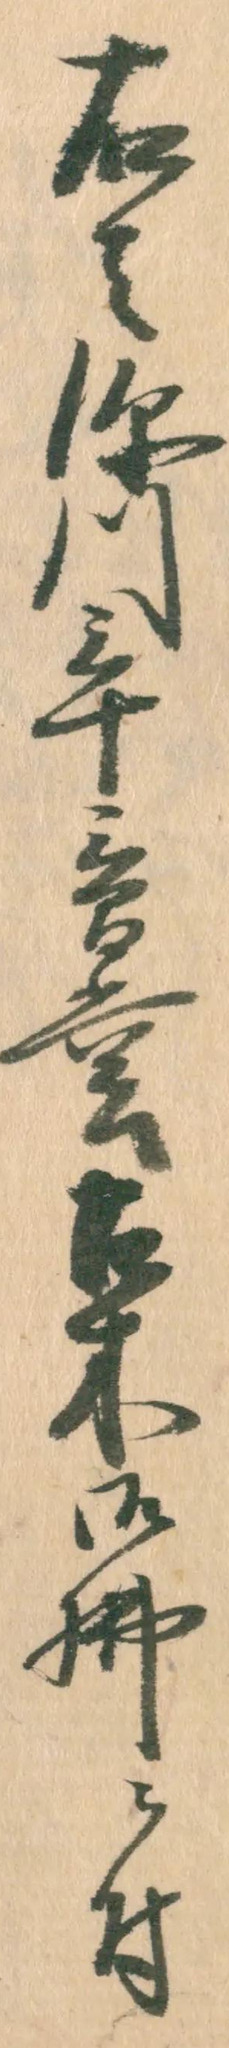右は深川三十三間同古木御払ニ付
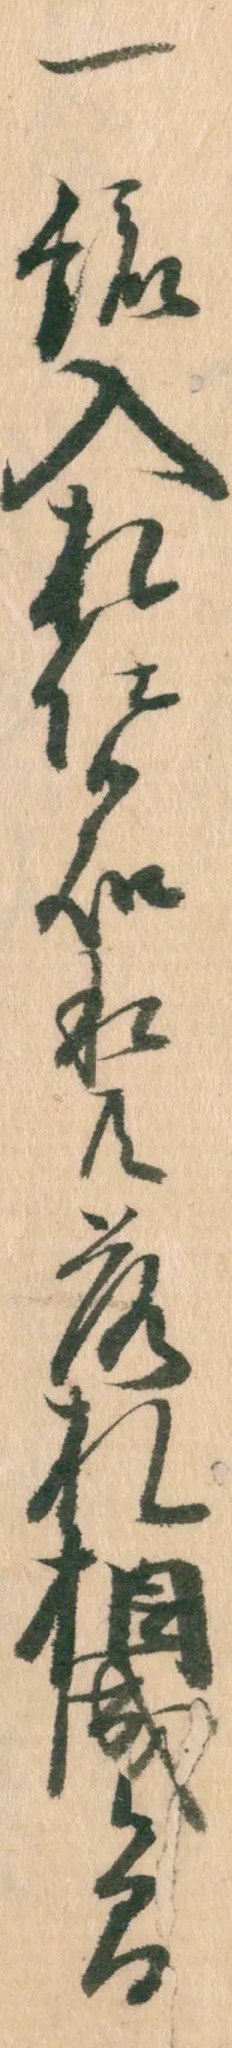一統入札仕候処私共落札相成候間
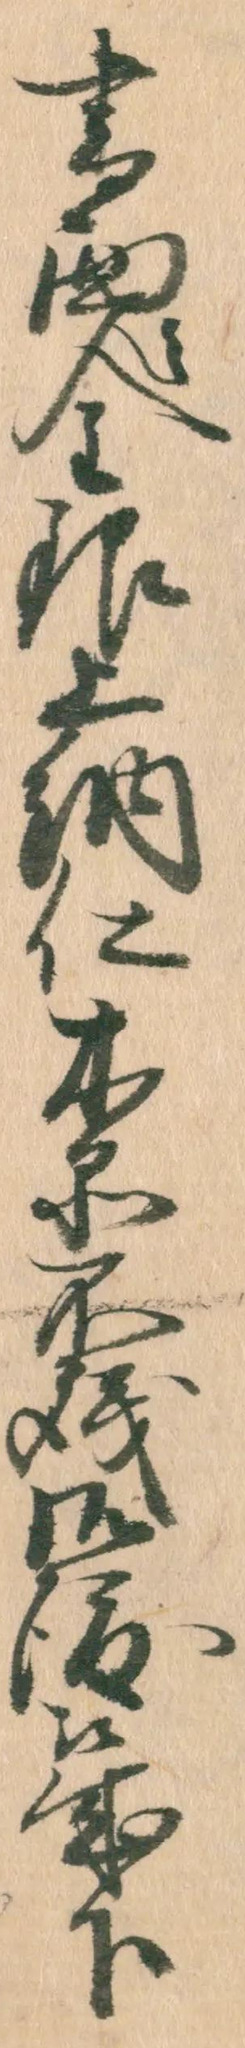書面之金銀上納仕木品不残御渡被成下
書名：三十三間堂. [2]
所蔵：国立国会図書館 National Diet Library, JAPAN
